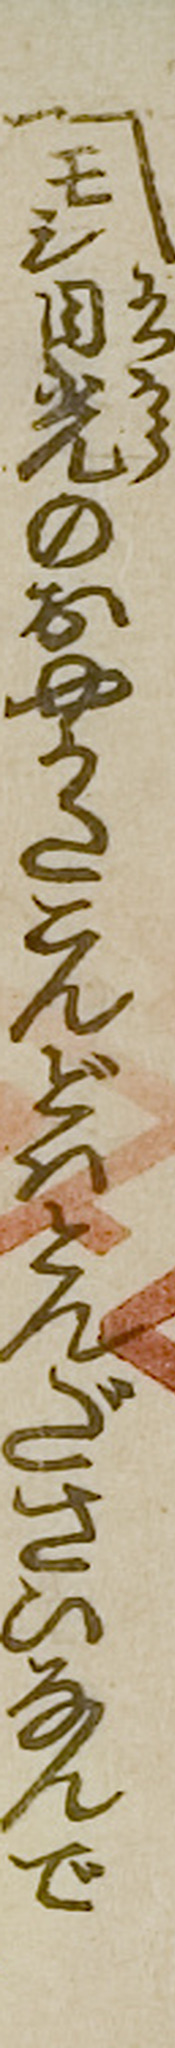「モシ日光のおやかたこんどはとんださいなんで
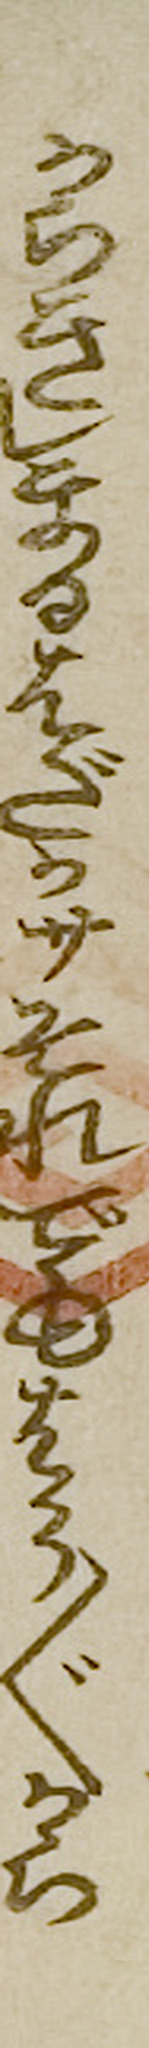からきしまるはだかサそれでもはうばうから
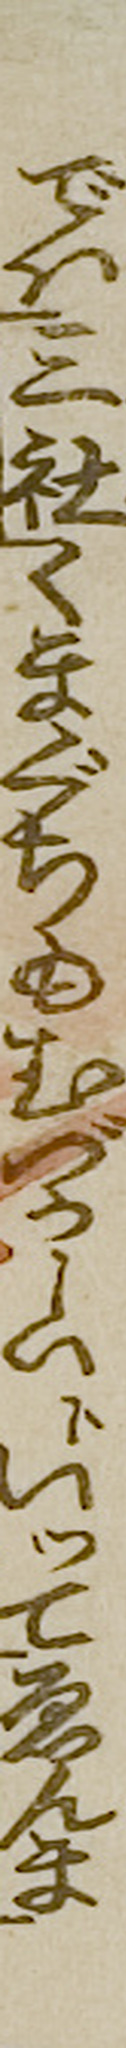では三社くまぐちもむづかしいトいってゑんま
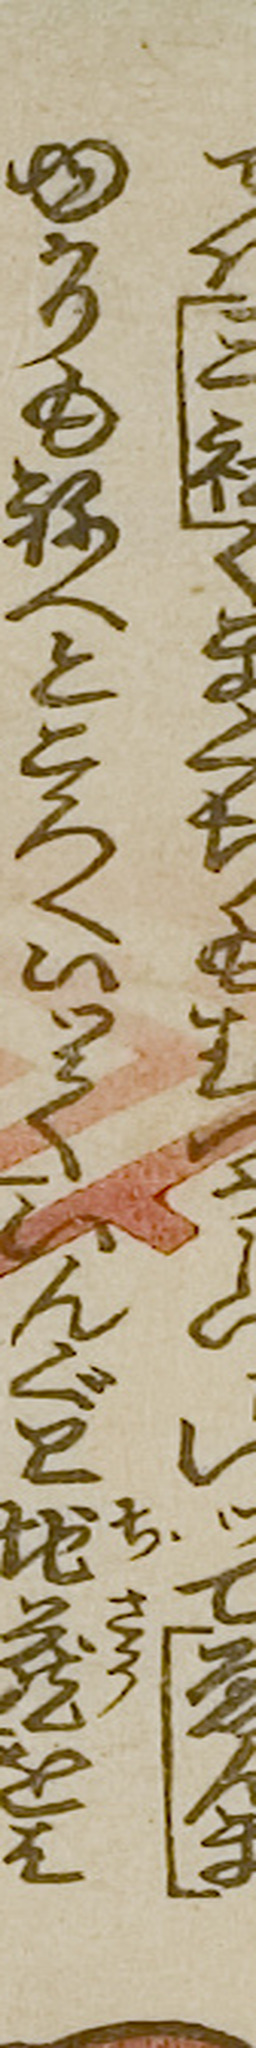ゆかりもねへところへいっていんぐわ地蔵をは
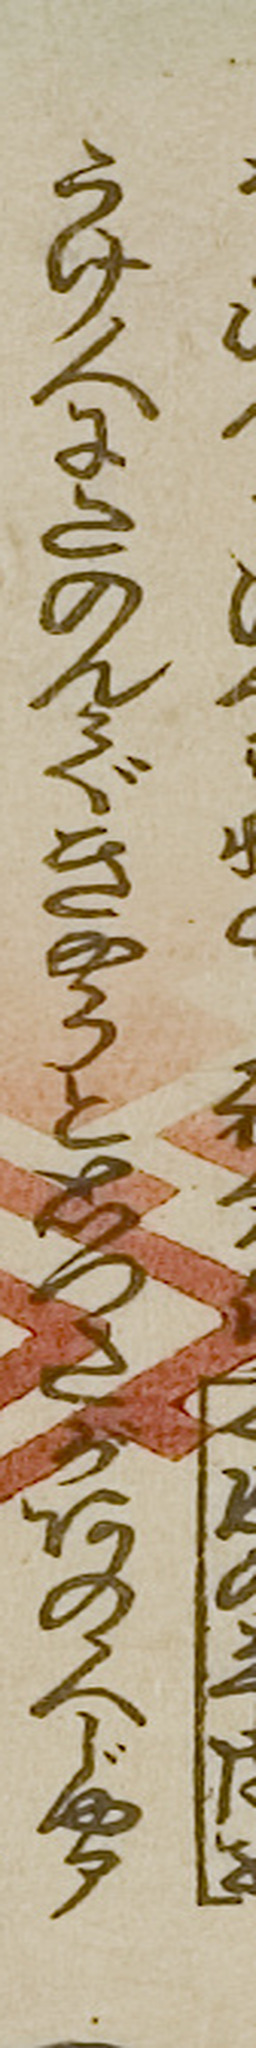うけ人にたのんできやうと思つたがあの人じやァ
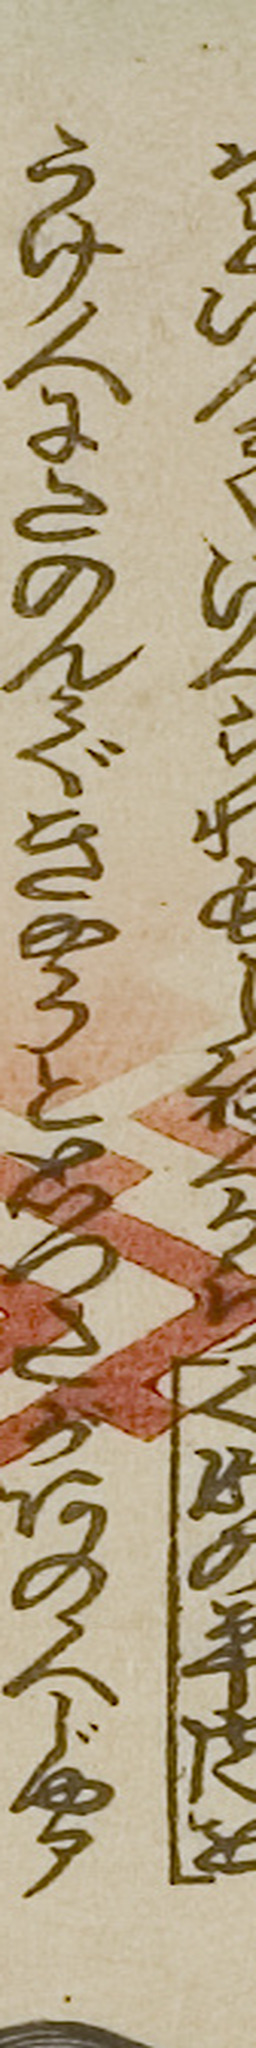うけ人にたのんできやうと思つたがあの人じやァ
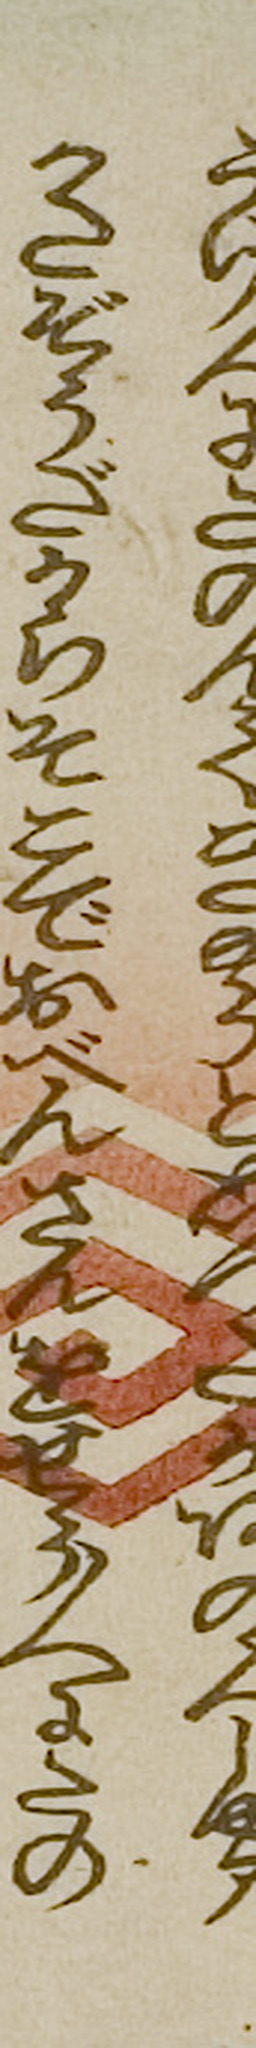かたぞうだからそこでおべんさんをせう人にたの
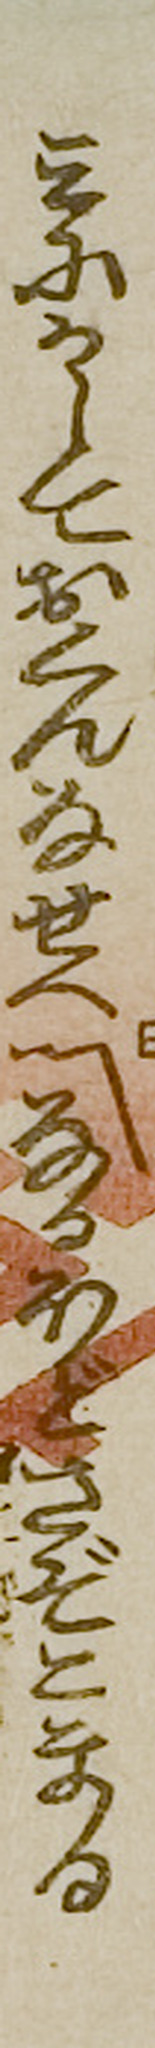みにかしておくんなせへ日「なるほどさぞこまる
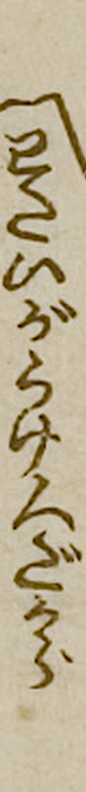「わたいがうけ人だから
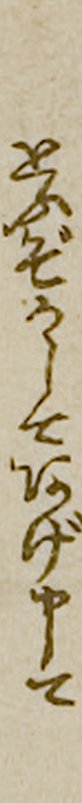とふぞかしてあげ申て
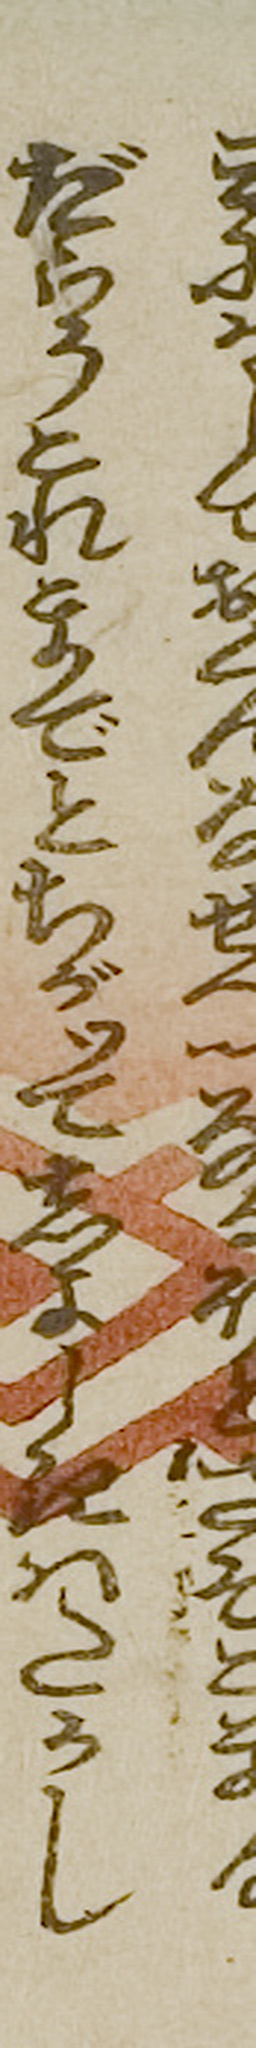だらうこれまでとちがってしよしきはたかし
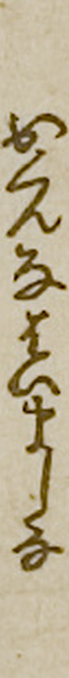おくんなさいましな
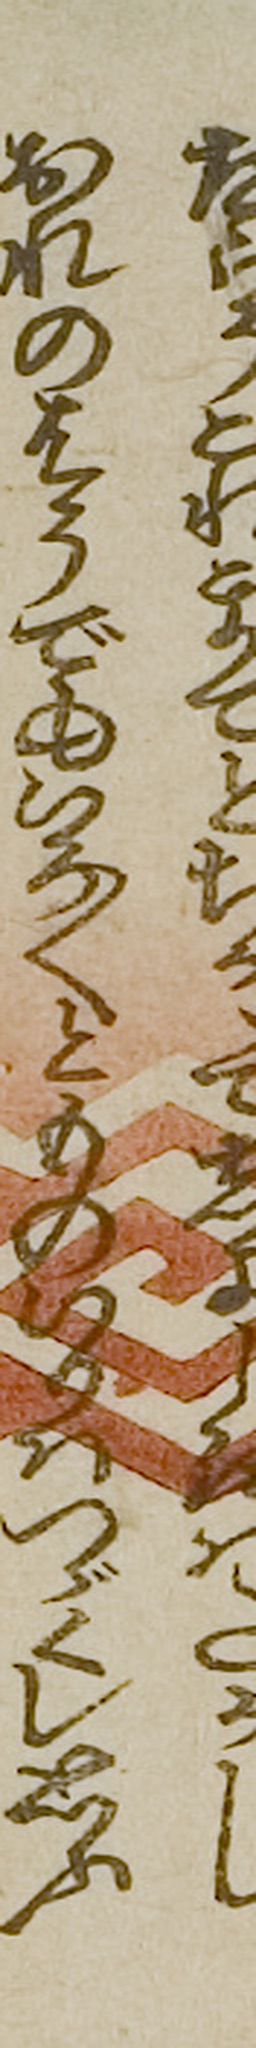おれのはうでもいろ〳〵とものいりはつゞくし思ふ
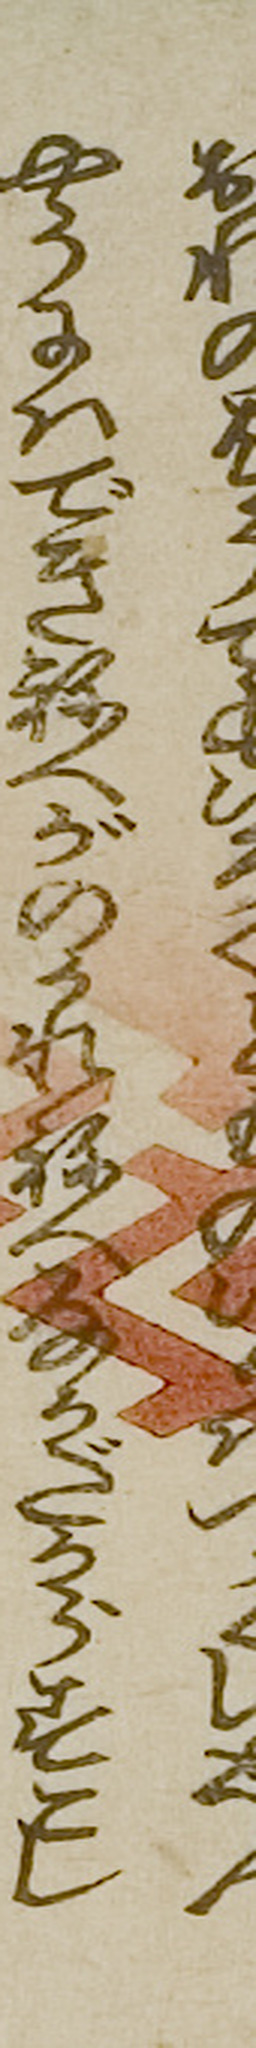やうにはできねへがのかれねへなかだからすこし
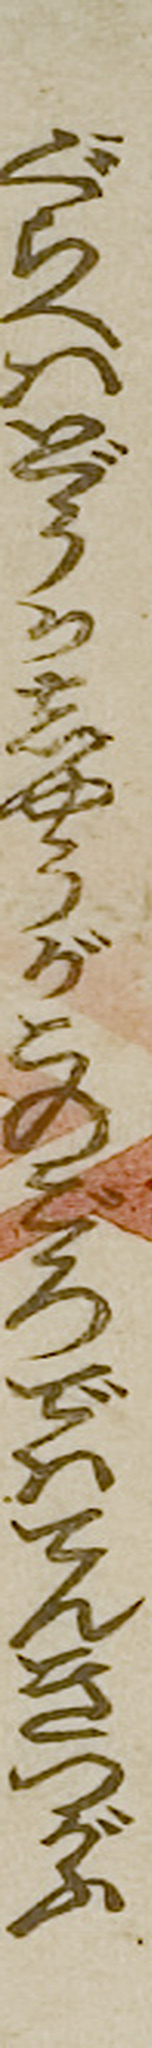ぐらへはどうかしやうがこのごろではてんきつがふ
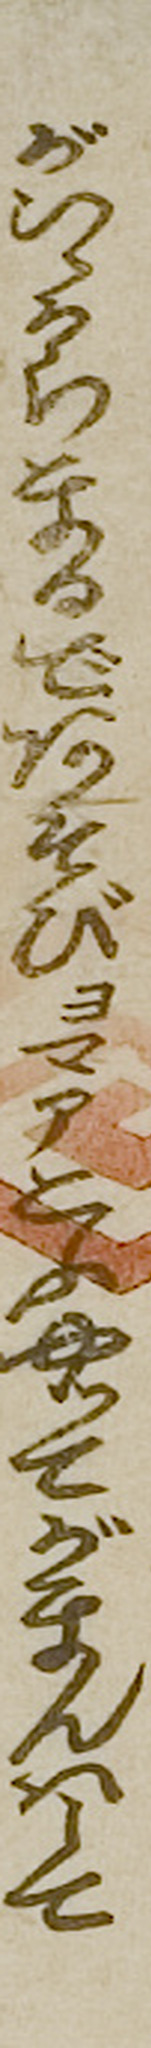がいゝからまるであそびヨマァこうやってがまんはして
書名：流行浮世咄し
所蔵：東京大学総合図書館 General Library in the University of Tokyo, JAPAN
